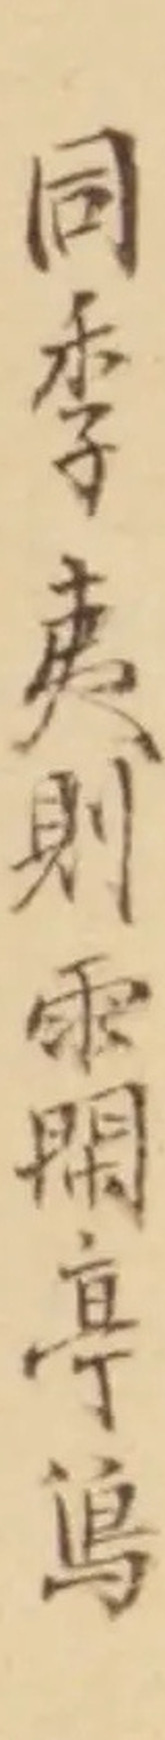同季夷則雨閑亭写

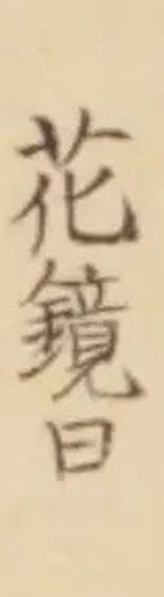花鏡曰
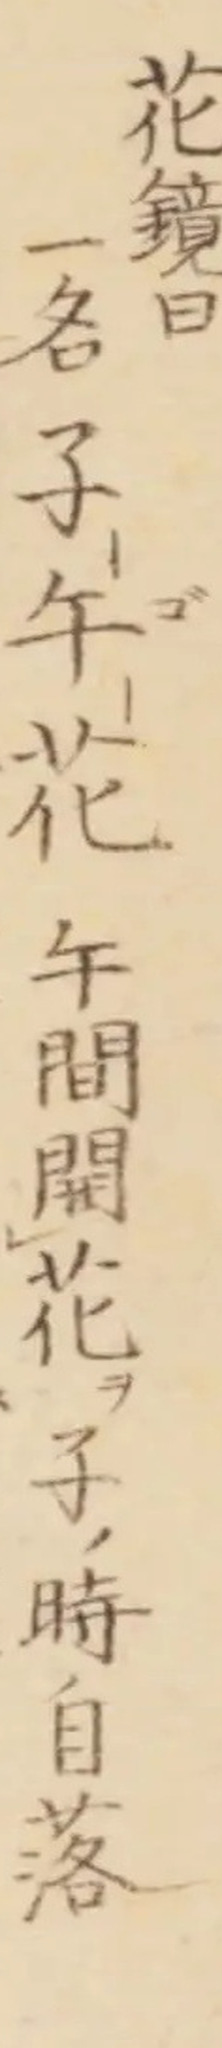一名子-午-花午間開花子時自落
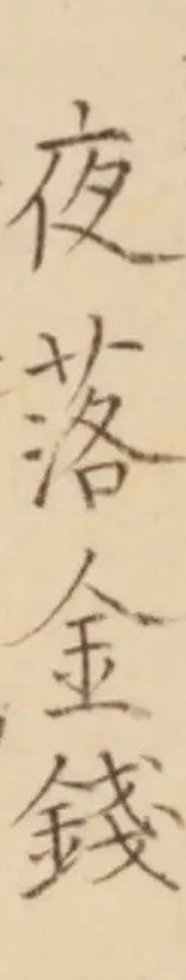夜落金銭
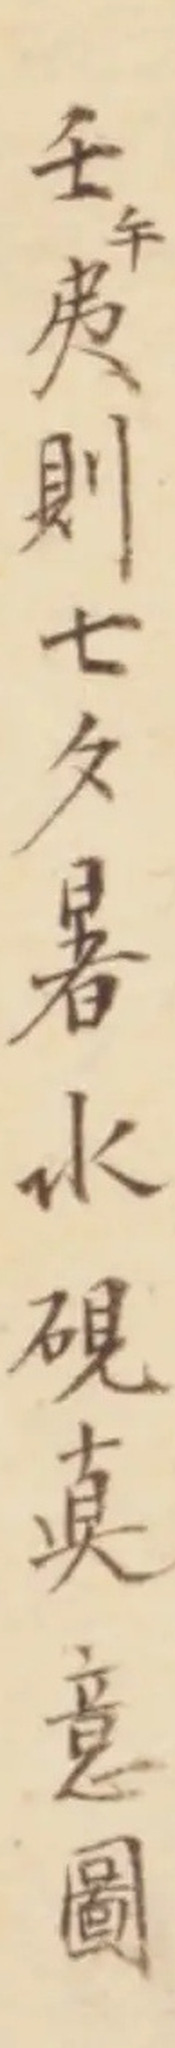壬午夷則七夕暑水硯真意図

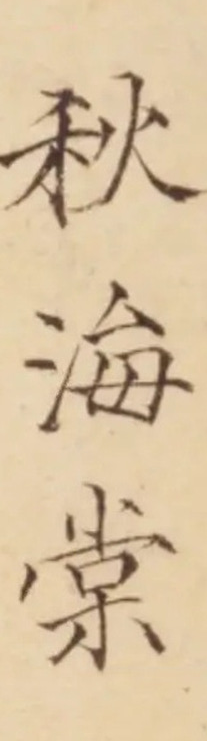秋海棠
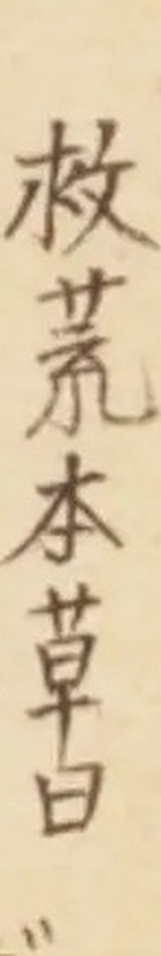救荒本草曰
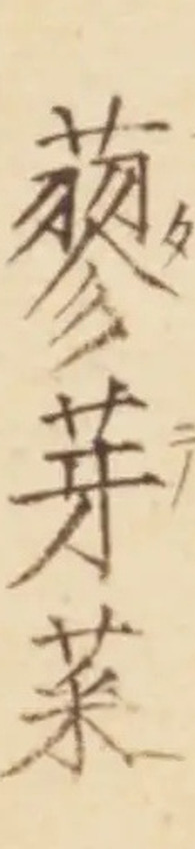蓼芽菜
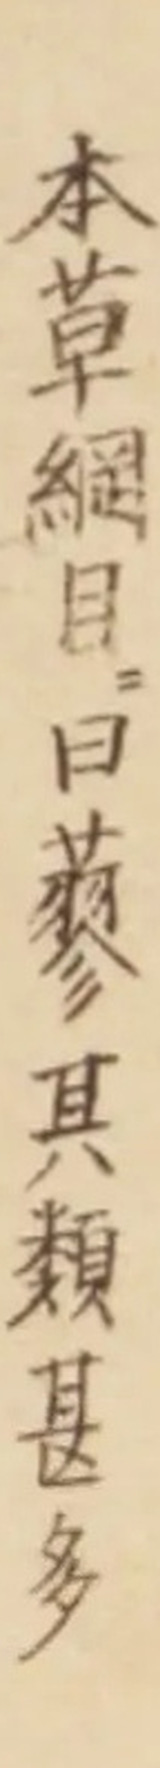本草綱目曰蓼其類甚多
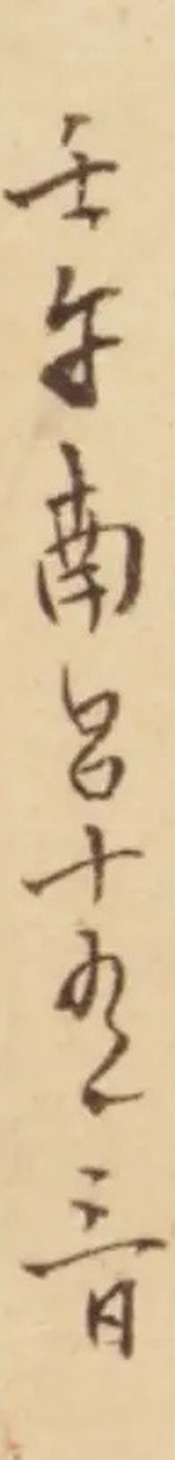壬午南呂十有三日

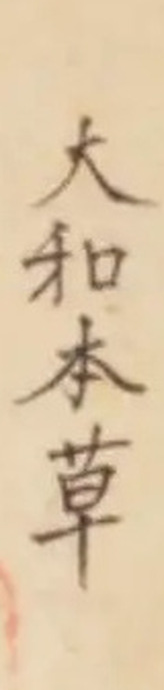大和本草
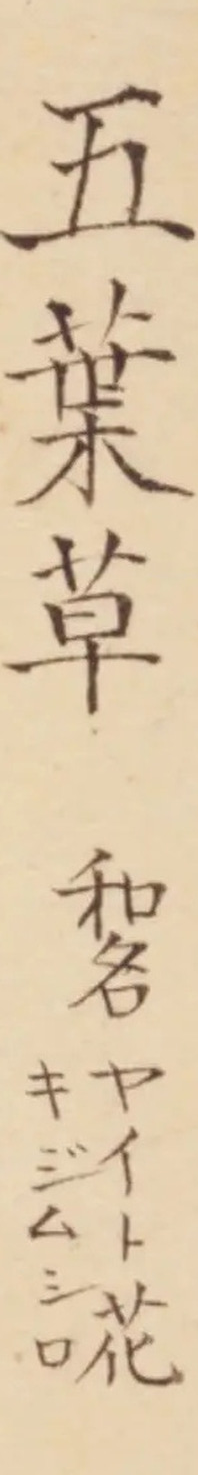五葉草和名ヤイト花
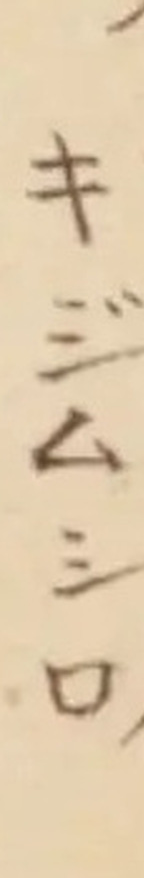キジムシロ
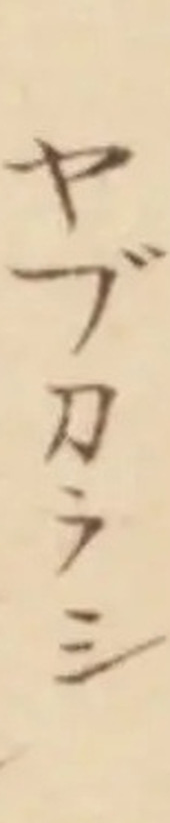ヤブカラシ
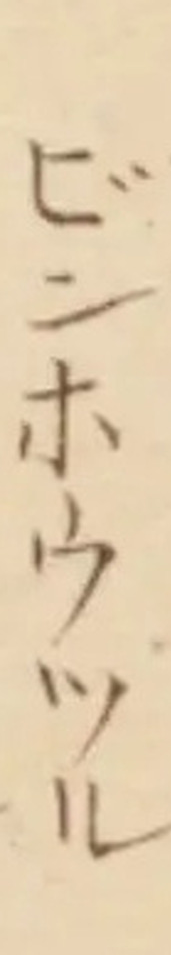ビンホウツル
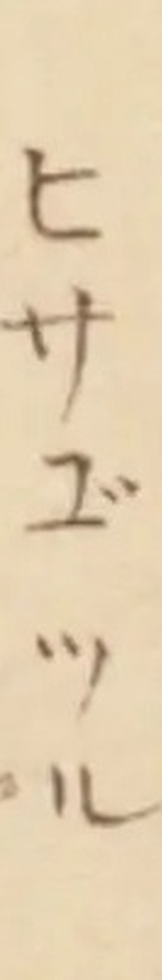ヒサゴツル
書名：梅園草木花譜秋之部. 1
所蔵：国立国会図書館 National Diet Library, JAPAN
